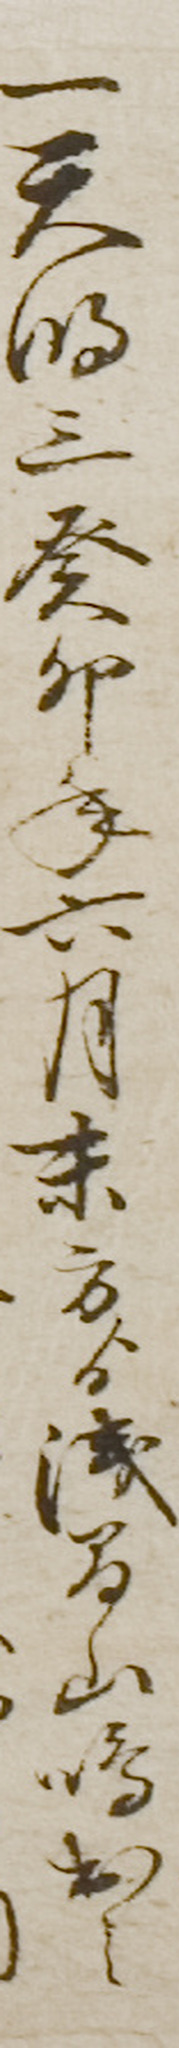一天明三癸卯年六月末方ゟ浅間山鳴出し
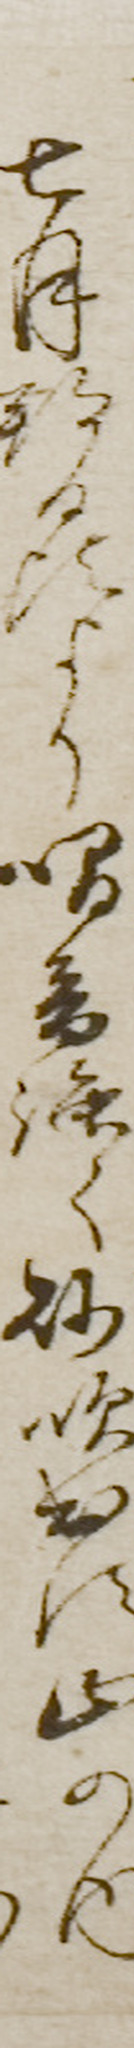七月朔日頃より鳴音強く砂吹出す山の内
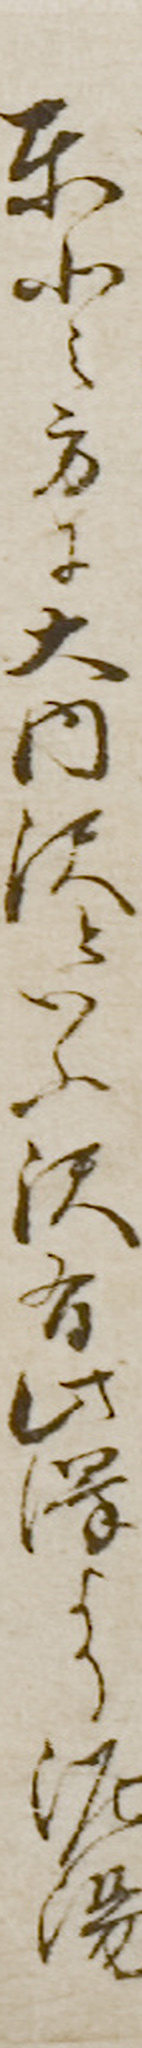東北之方に大門沢といふ沢有此澤より泥湯
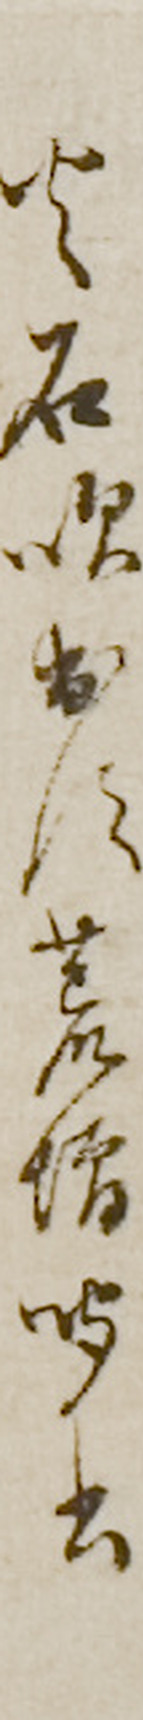火石吹出す荒増聞書
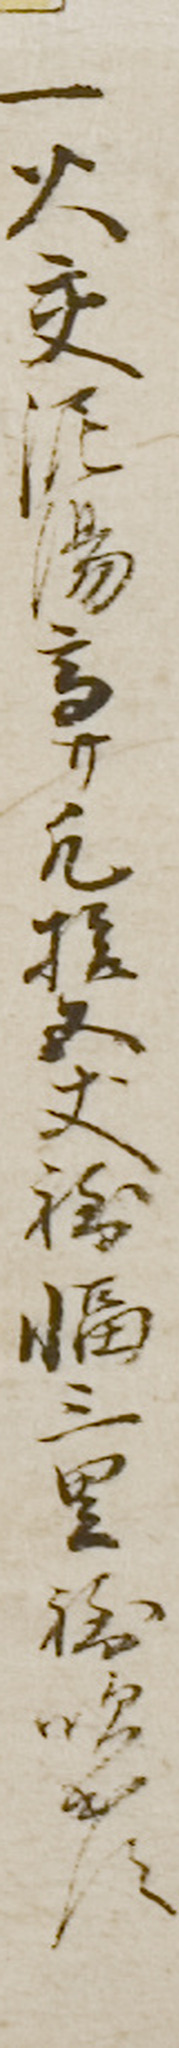一火交泥湯高サ凡拾五丈程幅三里程吹出す
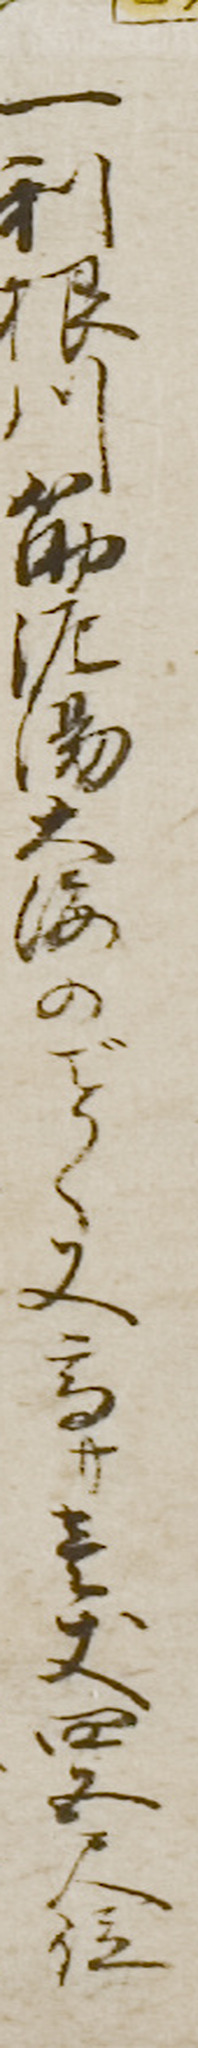一利根川筋泥湯大海のごとく又高サ壱丈四五尺位
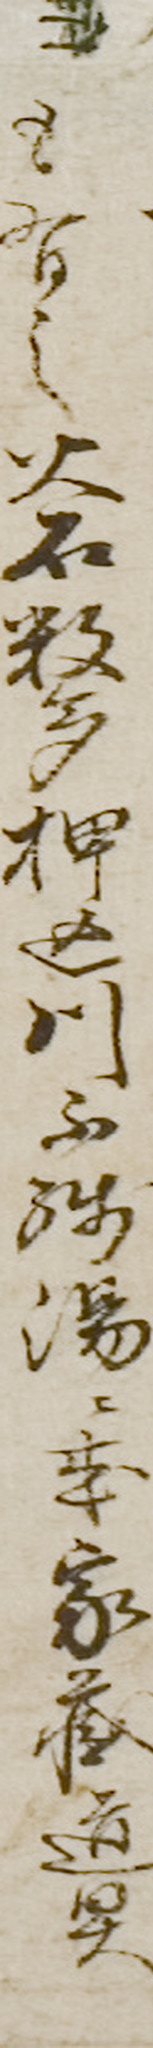も有之火石数多押込川不残湯二成家蔵道具
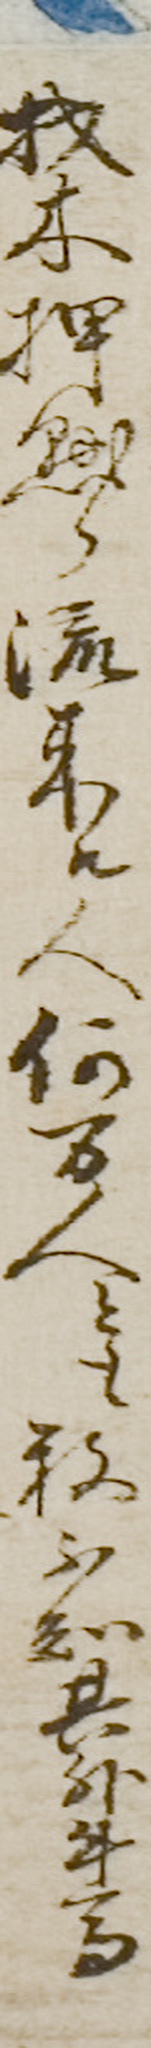材木押懸り流来ㇽ人なんまん何万人とも数不知其外牛馬
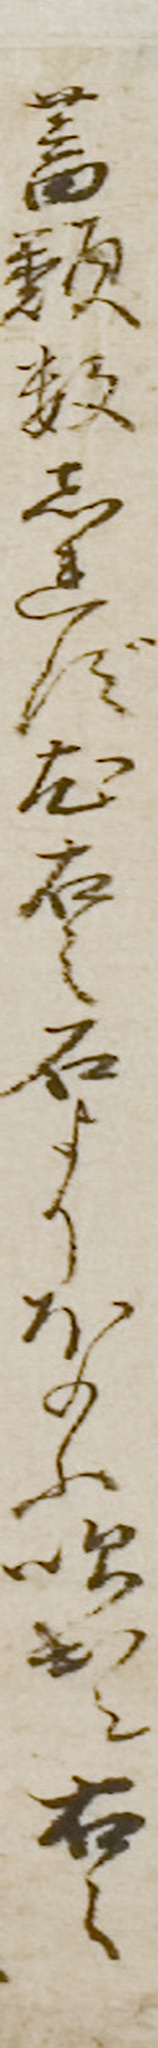畜類数しれず尤右之石よりほのふ吹出シ右之
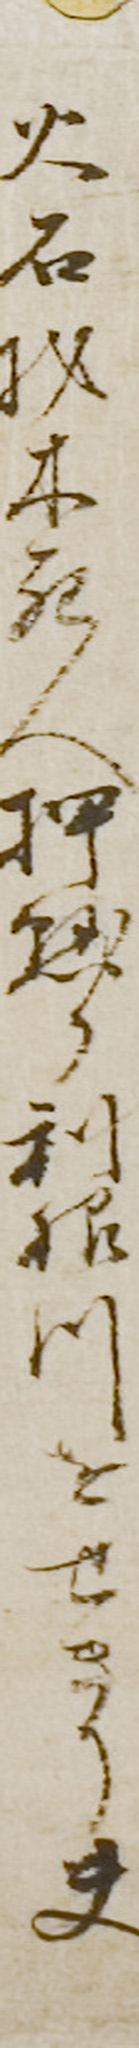火石材木死人押懸り利根川をせきり夫
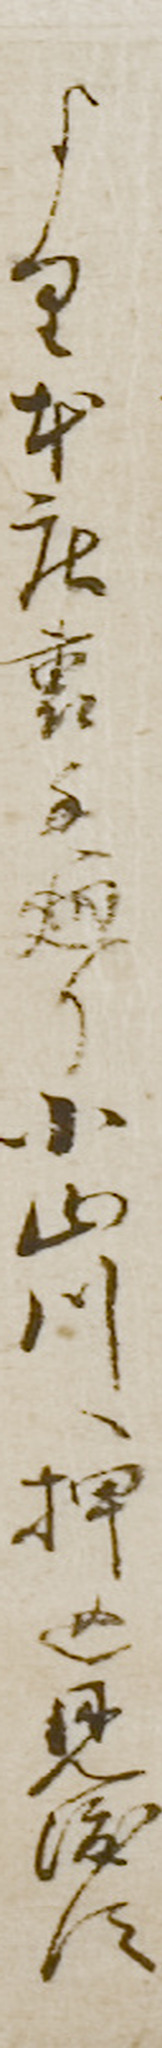より本庄裏手二廻り小山川へ押込見渡す
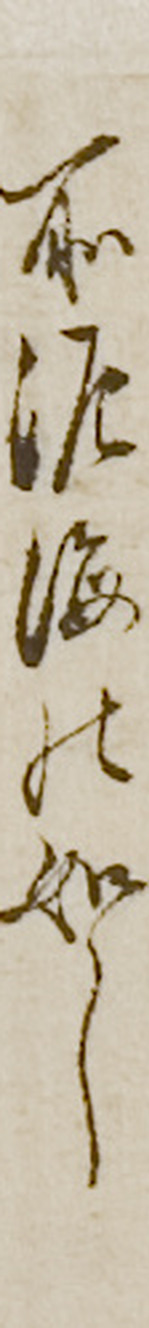所泥海の如し
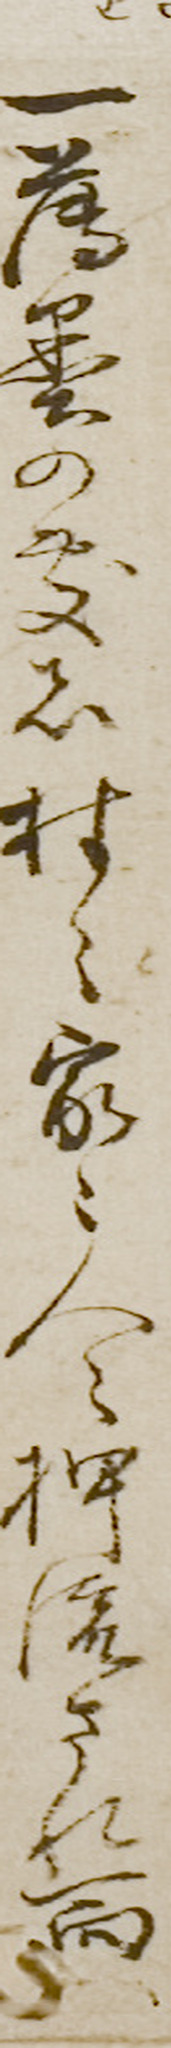一薄墨の処者村々家々人々押流され一向
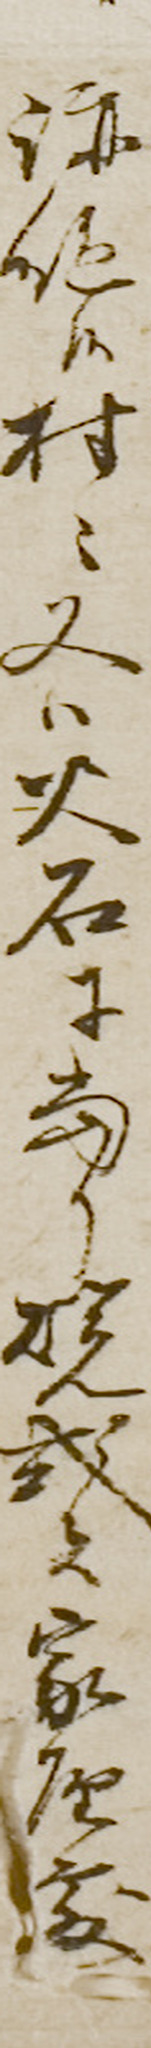跡嶋候村々又ハ火石に当り焼或者家屋敷
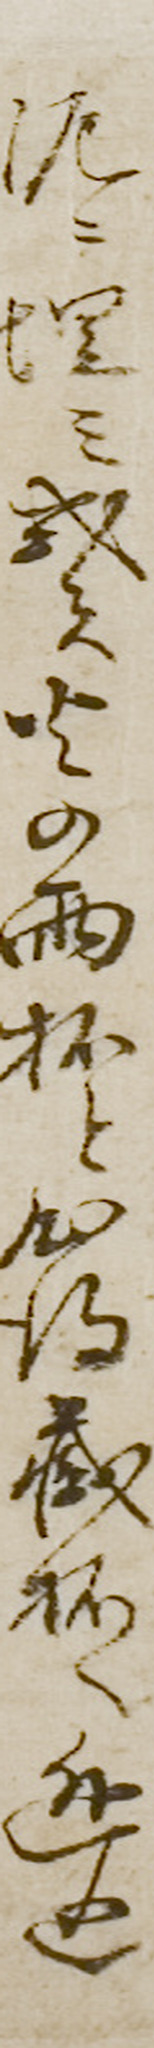泥二埋ミ或者火の雨抔と心得蔵抔へ逃込
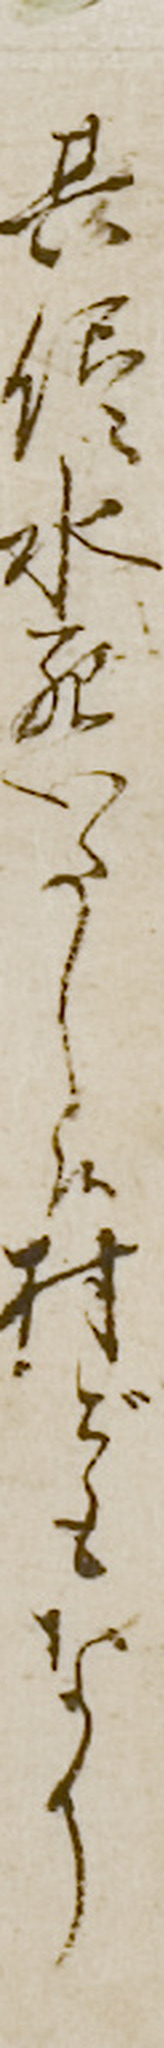其侭水死いたし候村どもなり
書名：[天明三年浅間山噴火]
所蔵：東京大学総合図書館 General Library in the University of Tokyo, JAPAN
